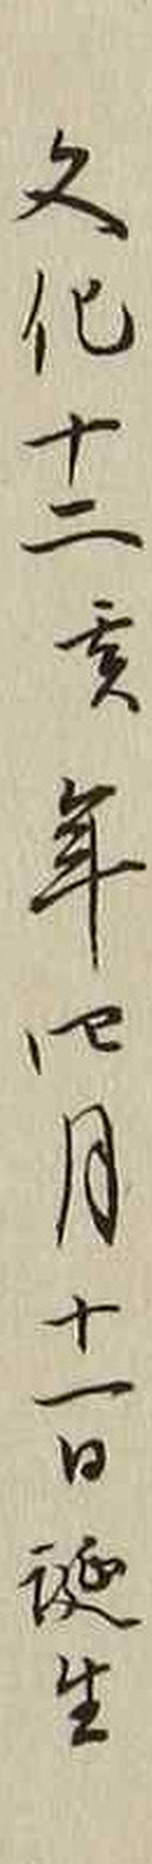文化十二亥年四月十一日誕生
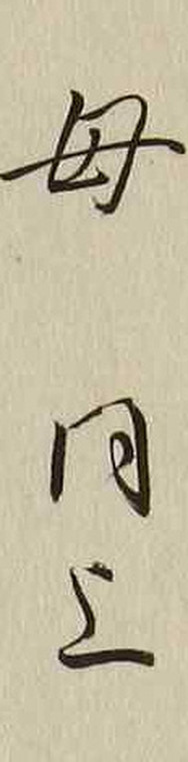母同上
